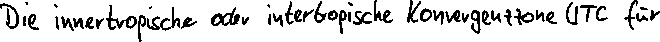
Die innertropische oder intertropische Konvergenzzone (ITC für
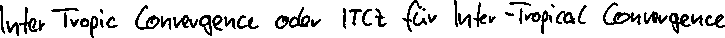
nter Tropic Convergence oder ITCZ für Inter-Tropical Convergence
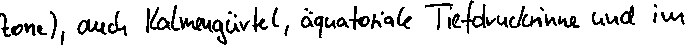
Zone), auch Kalmengürtel, äquatoriale Tiefdruckrinne und im
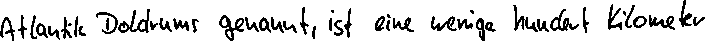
Atlantik Doldrums genannt, ist eine wenige hundert Kilometer
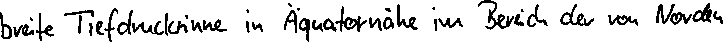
breite Tiefdruckrinne in Äquatornähe im Bereich der von Norden
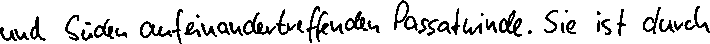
und Süden aufeinandertreffenden Passatwinde. Sie ist durch
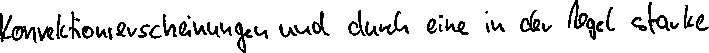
Konvektionserscheinungen und durch eine in der Regel starke
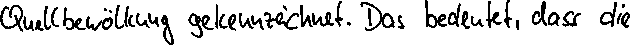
Quellbewölkung gekennzeichnet. Das bedeutet, dass die
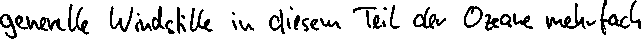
generelle Windstille in diesem Teil der Ozeane mehrfach
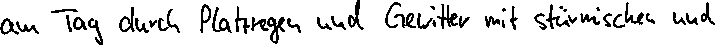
am Tag durch Platzregen und Gewitter mit stürmischen und
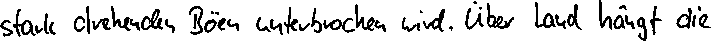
stark drehenden Böen unterbrochen wird. Über Land hängt die
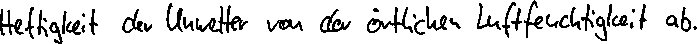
Heftigkeit der Unwetter von der örtlichen Luftfeuchtigkeit ab.
